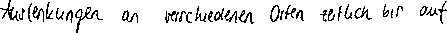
Auslenkungen an verschiedenen Orten zeitlich bis auf
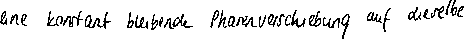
eine konstant bleibende Phasenverschiebung auf dieselbe
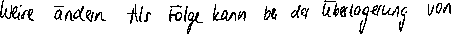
Weise ändern. Als Folge kann bei der Überlagerung von
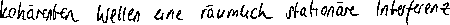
kohärenten Wellen eine räumlich stationäre Interferenz
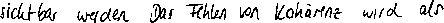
sichtbar werden. Das Fehlen von Kohärenz wird als
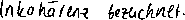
Inkohärenz bezeichnet.
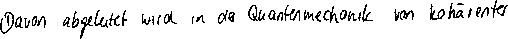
Davon abgeleitet wird in der Quantenmechanik von kohärenter
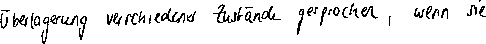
Überlagerung verschiedener Zustände gesprochen, wenn sie
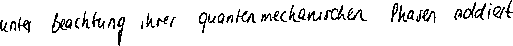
unter Beachtung ihrer quantenmechanischen Phasen addiert
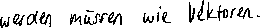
werden müssen wie Vektoren.
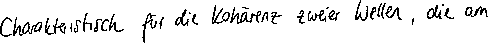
Charakteristisch für die Kohärenz zweier Wellen, die am
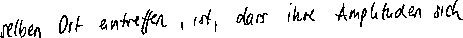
selben Ort eintreffen, ist, dass ihre Amplituden sich
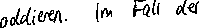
addieren. Im Fall der
